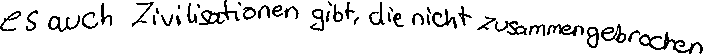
es auch Zivilisationen gibt, die nicht zusammengebrochen
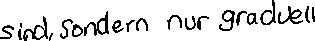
sind, sondern nur graduell
